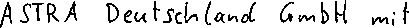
ASTRA Deutschland GmbH mit
